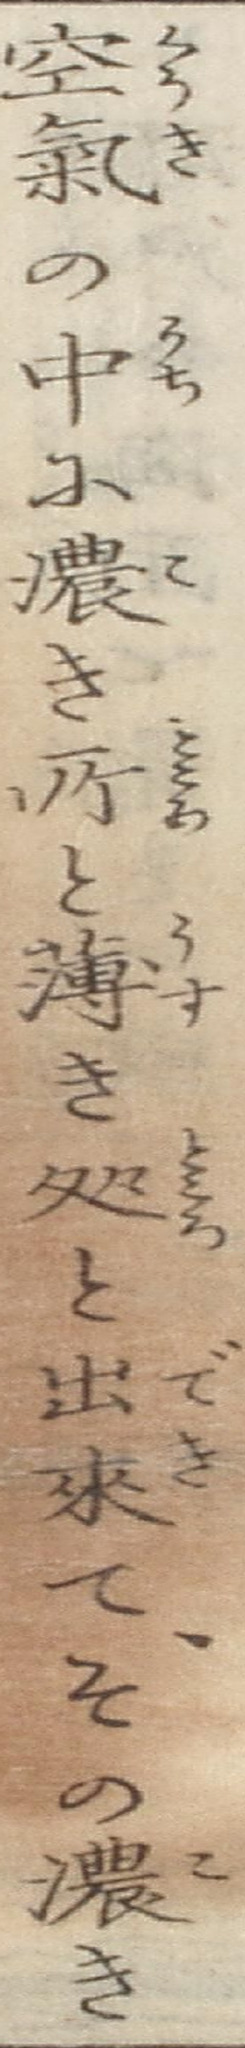空気の中に濃き所と薄き処と出来て、その濃き
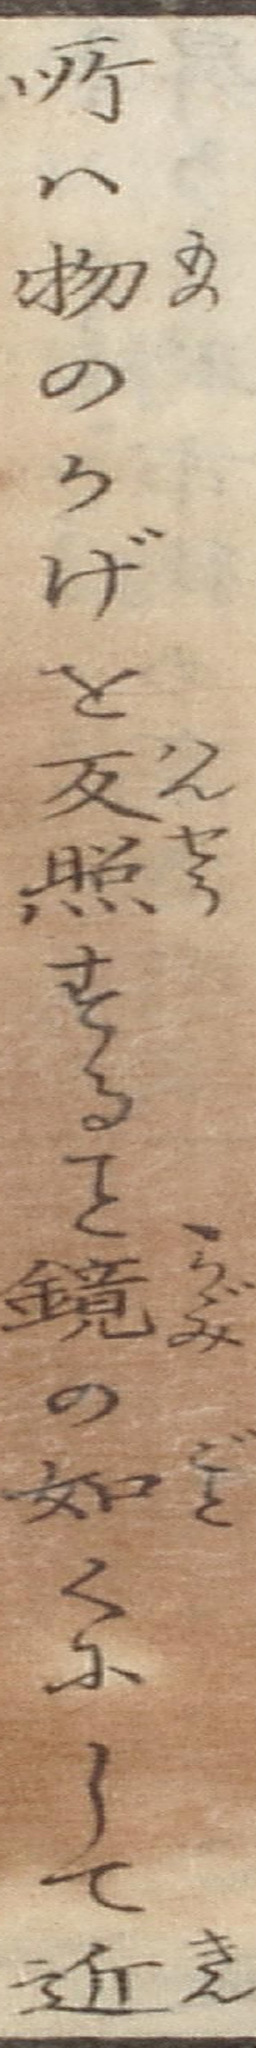所は物のかげを反照すること、鏡の如くにして近
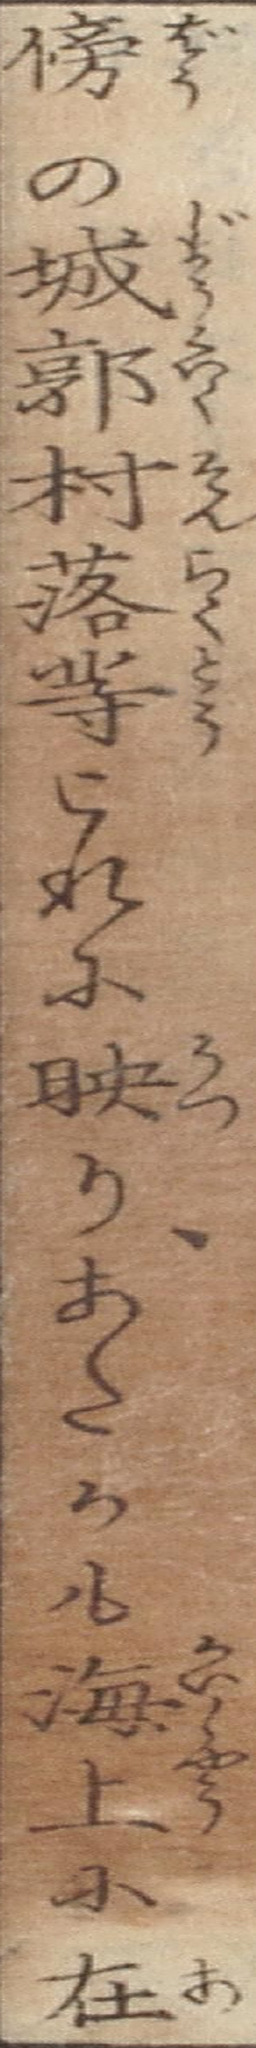傍の城郭村落等これに映り、あたかも海上に在
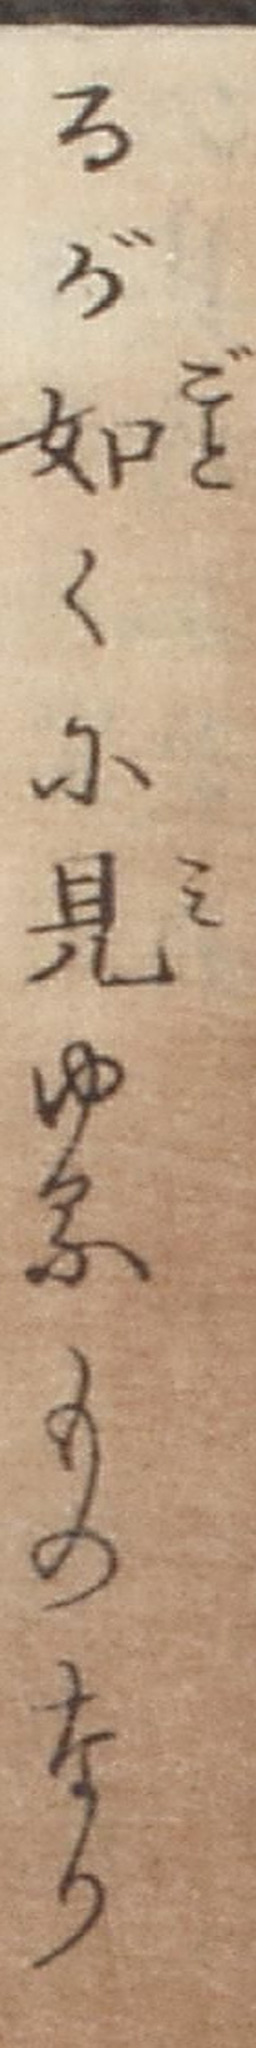るが如くに見ゆるものなり
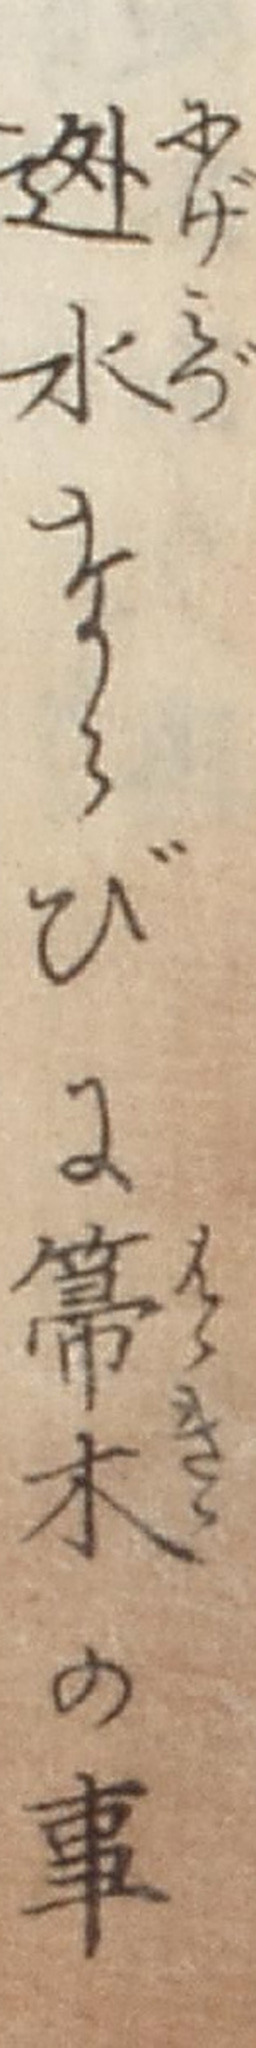逃水ならびに箒木の事
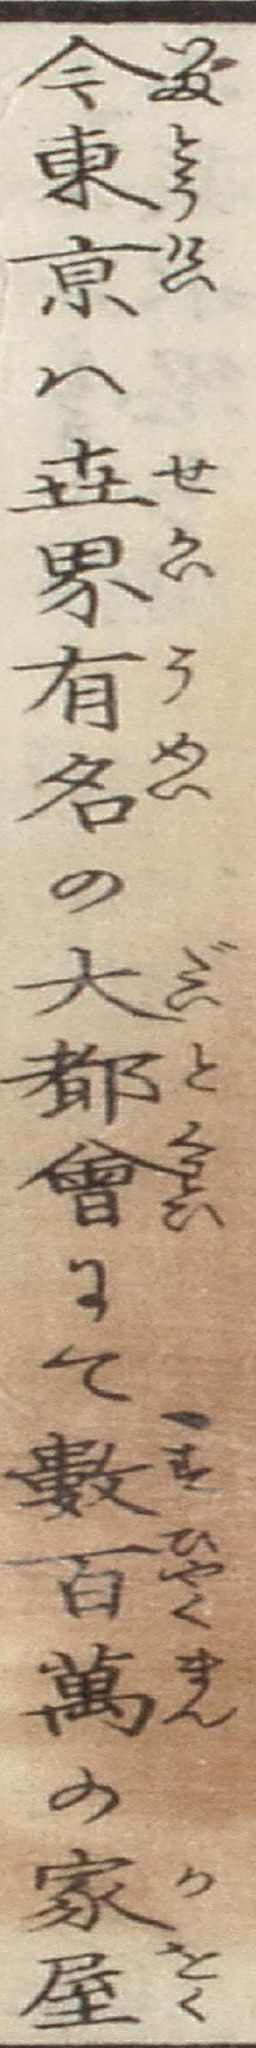今東京は世界有名の大都会にて、数百萬の家屋
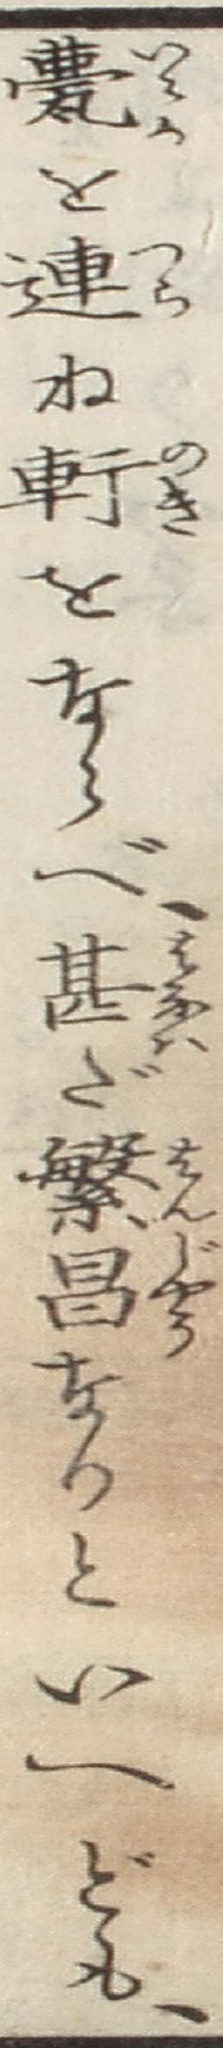甍を連ね軒をならべ、甚だ繁昌なりといへども、
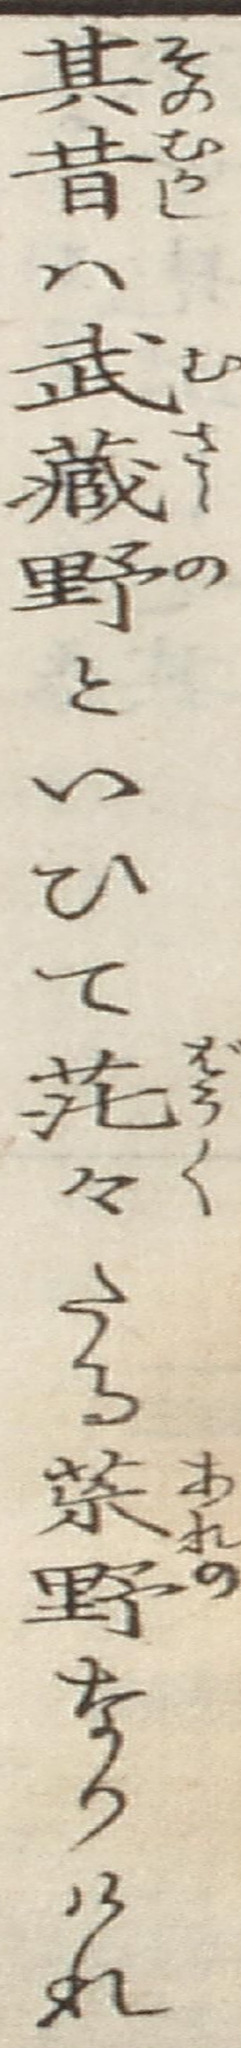其昔は武蔵野といひて茫々たる荒野なりけれ
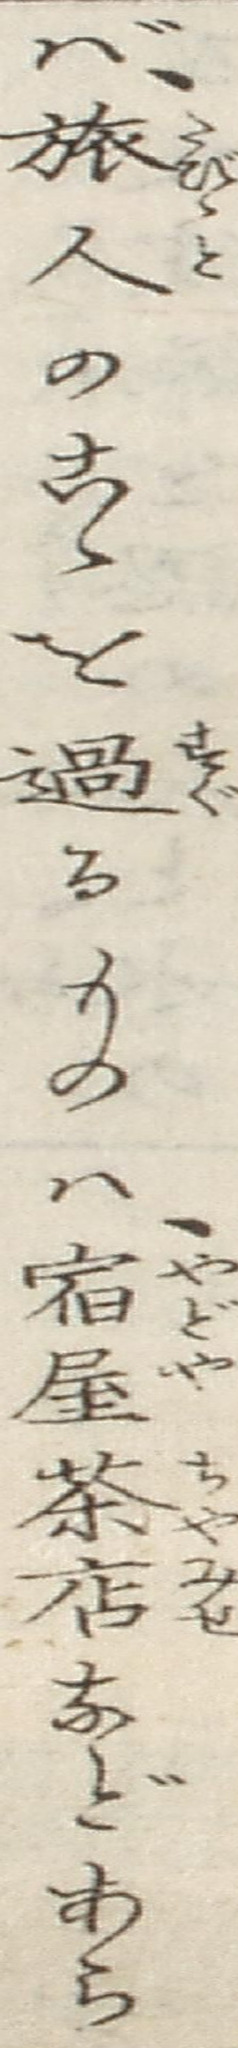ば、旅人のこゝを過るものは、宿屋茶店などあら
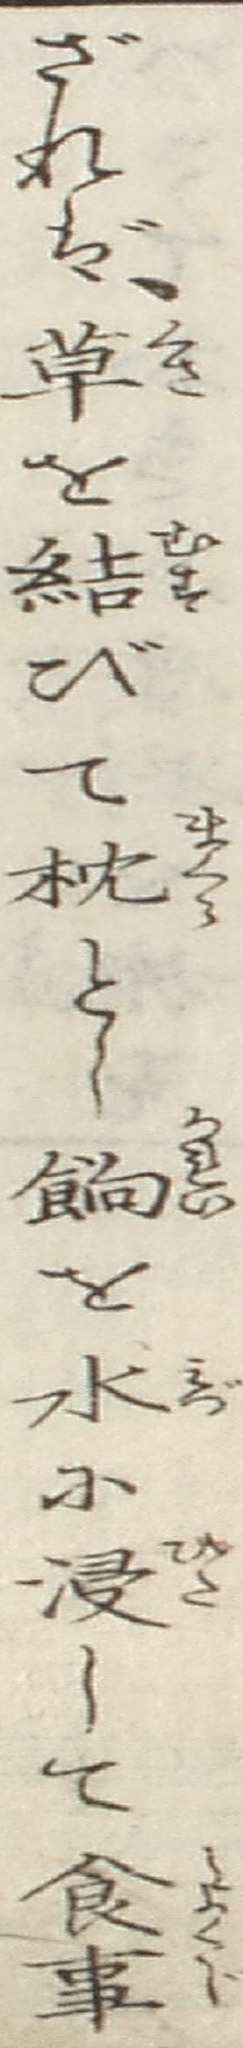ざれば、草を結びて枕とし餉を水に浸して食事
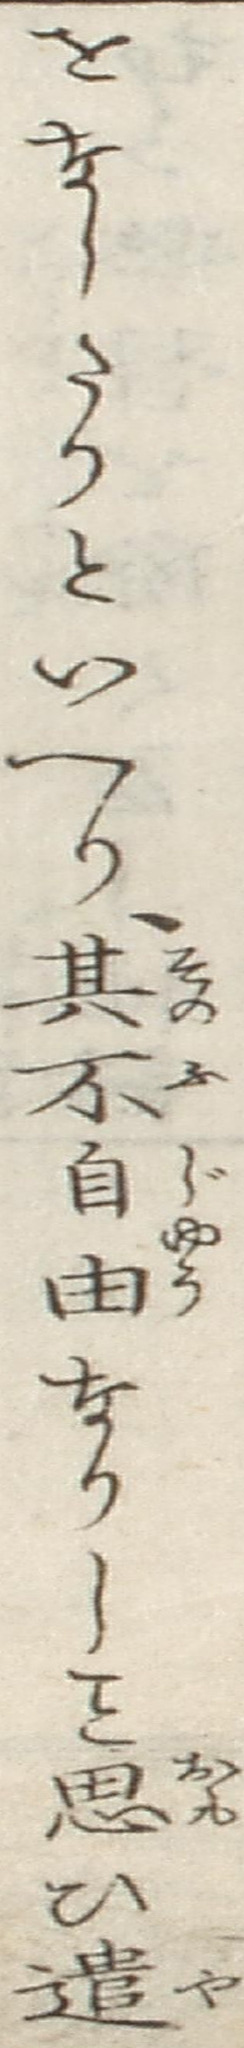をなしたりといへり、其不自由なりしこと思ひ遣
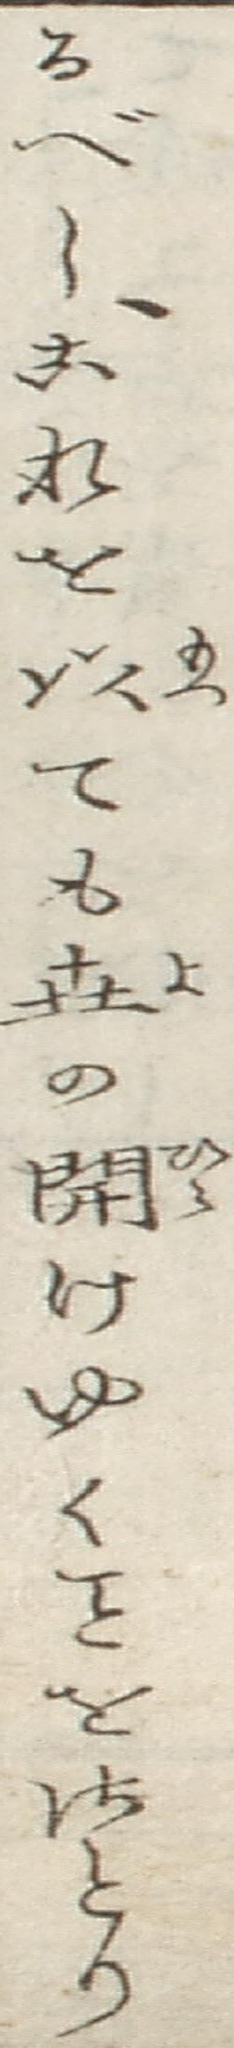るべし、これを以ても世の開けゆくことをさとり

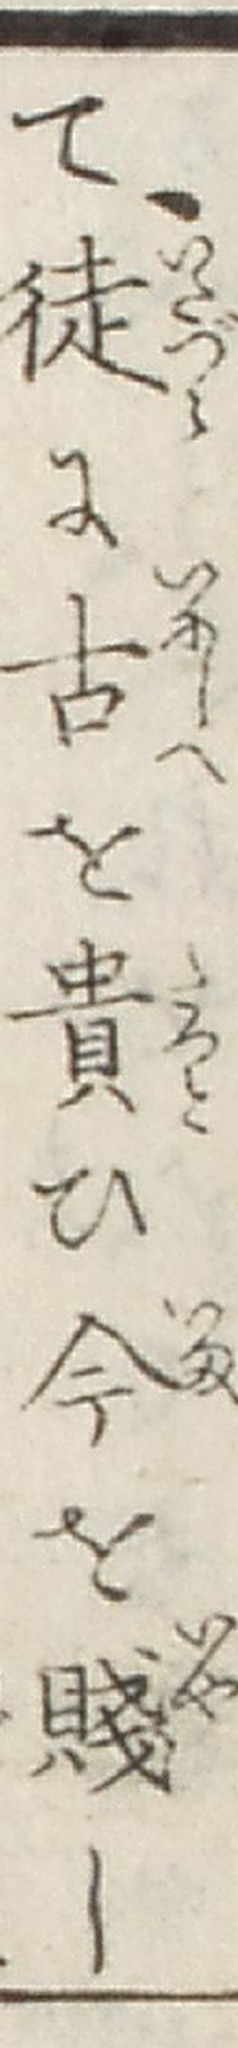て、徒に古を貴ひ今を賎し
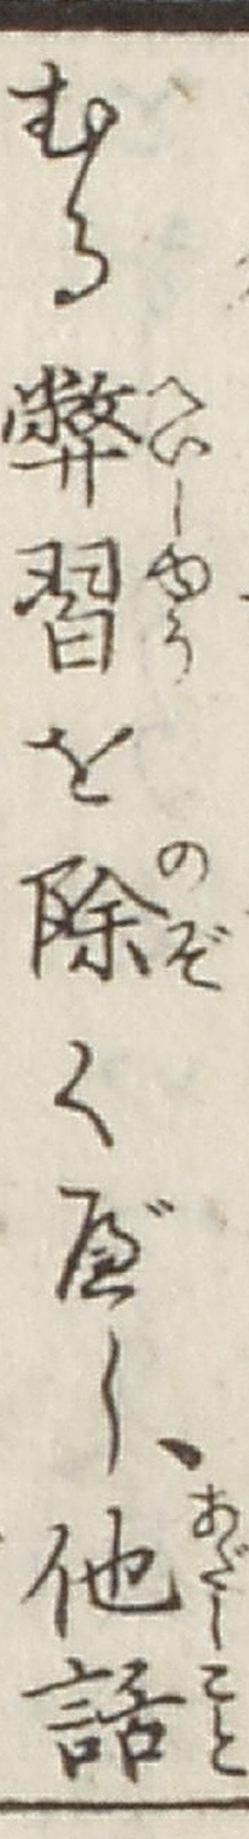むる弊習を除くべし、他話
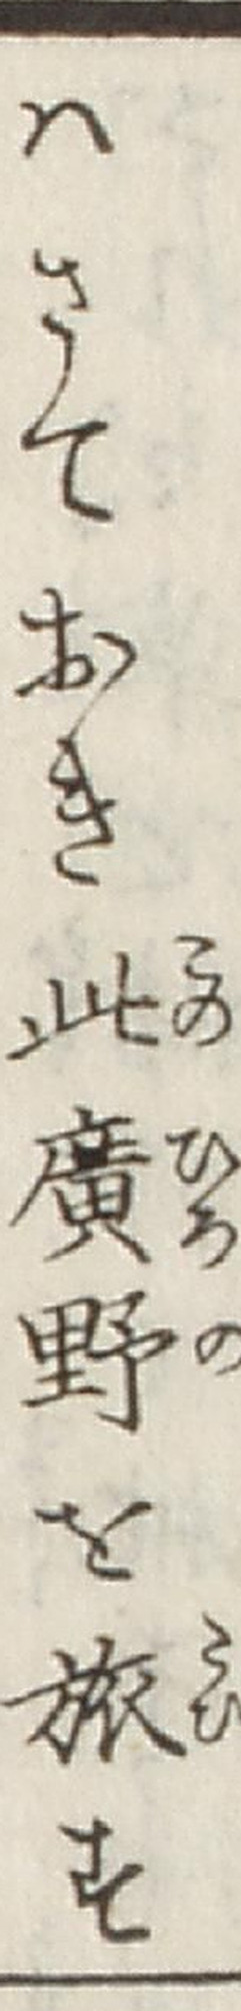はさておき此広野を旅す
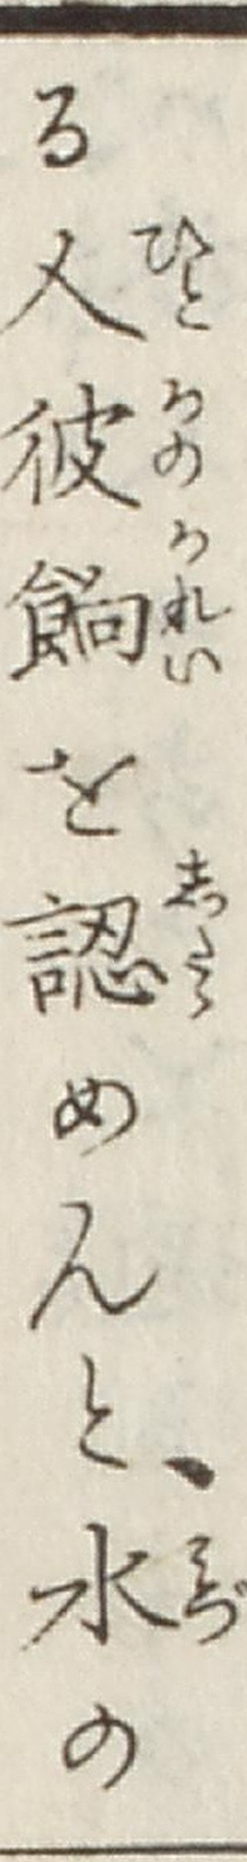る人彼餉を認めんと、水の
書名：変異辯　一名、天變地異拾遺　全
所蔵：東京大学地震研究所図書室 Earthquake Research Institute Library, The University of Tokyo, JAPAN
